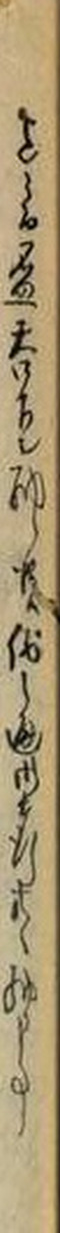迄にて盃呑下シ納之儀は例之通御奉行共へ納申事
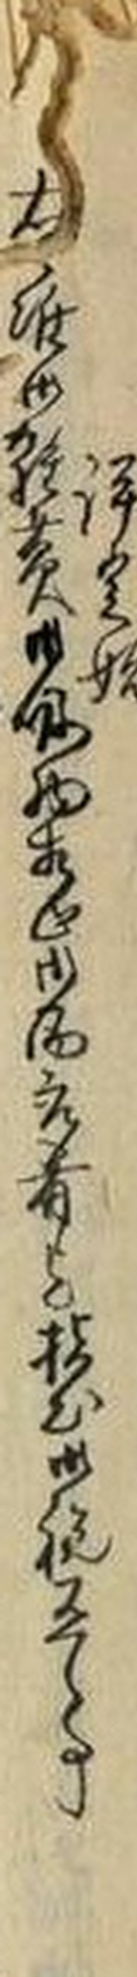右に准御雑煮御吸物相止御酒取肴迄指出御祝有之事
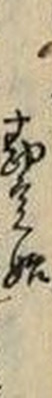勘定始
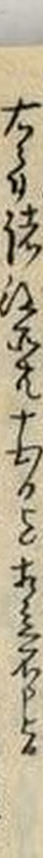右に付諸役所共十五日迄相立不申旨
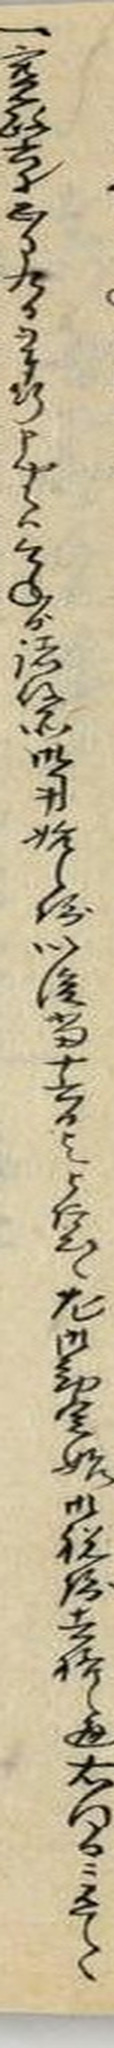一寛政六刁正月九日御奉行申聞候は今年ゟ諸役所御用始之儀以後当十六日与被仰出候尤御勘定始御祝儀先格之通右同日に有之候
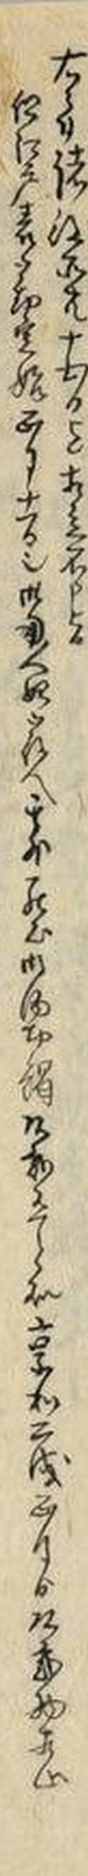但江戸表御勘定始正月十一日也御用人始御役人其外罷出御酒切鯣頂戴有之候処享和二戌正月ゟ頂戴物相止
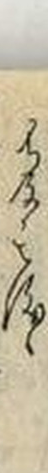不及其儀候
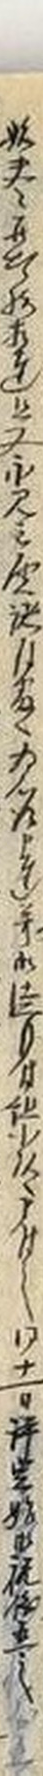始夫々罷出候様相達且又永見主殿諸月番へ為心得申達并御徒目付組小頭へ申付之同十一日評定始御祝儀在之
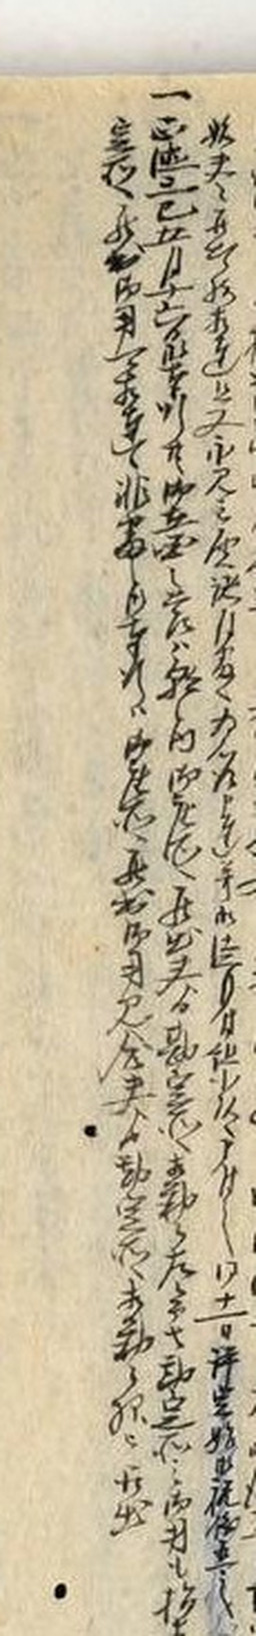定所へ罷出御用可相達候非番之御奉行は御座所へ罷出御用見合夫ゟ勘定所へ相勤候様被罷出

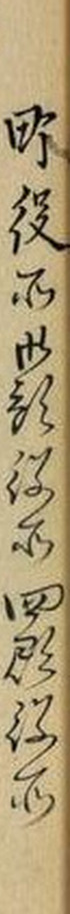町役所御預役所四郡役所
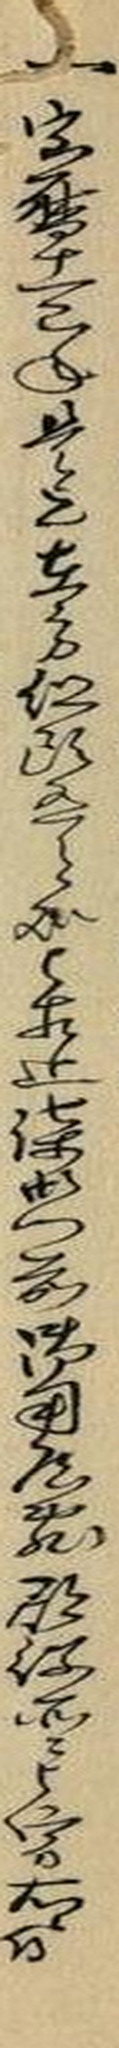一宝暦十一巳年是迄在方組頭有之候処被相止漆御門前御用屋敷郡役所に被仰付右に付
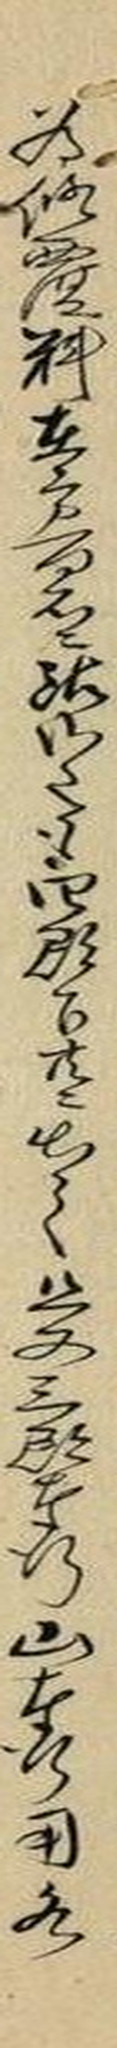為修覆料在方百石に銀弐匁ツヽ四郡下共に出之且又三郡奉行山奉行用水
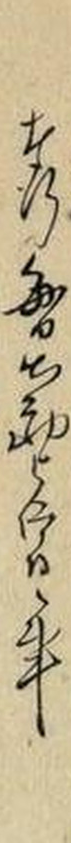奉行毎日出勤被仰付候事
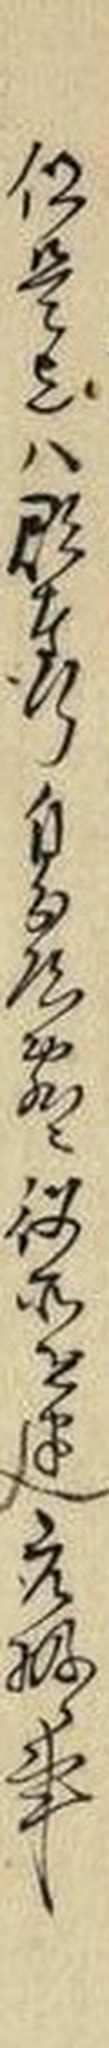但是迄は郡奉行自分屋敷に役所を建取扱候事
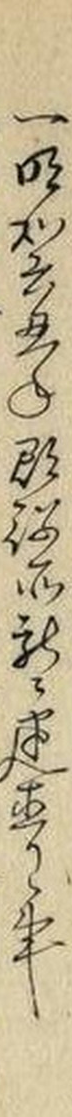一明和六丑年郡役所新に建直り候事
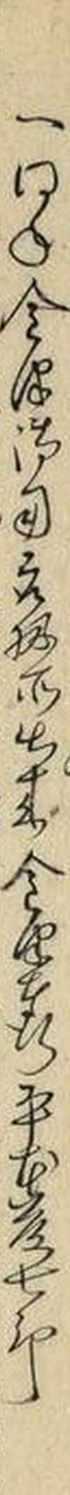一同年金津御用取扱所出来金津奉行平本藤七郎
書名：御城下諸事之部
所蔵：福井県文書館 Fukui Prefectural Archives
